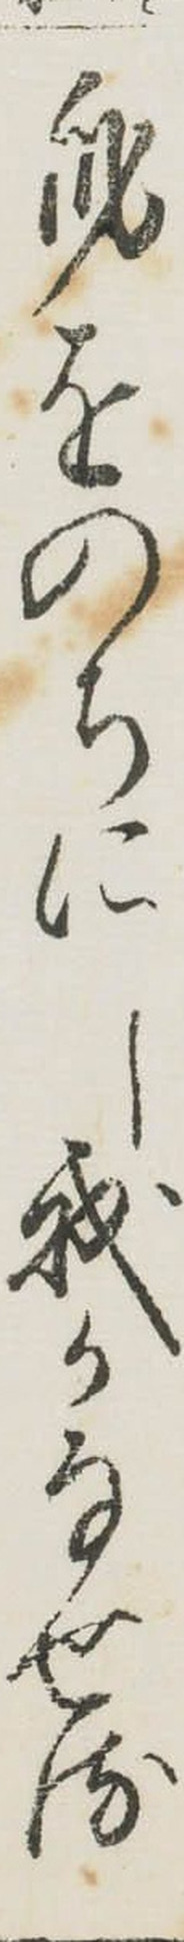身をのちにし我かなせる
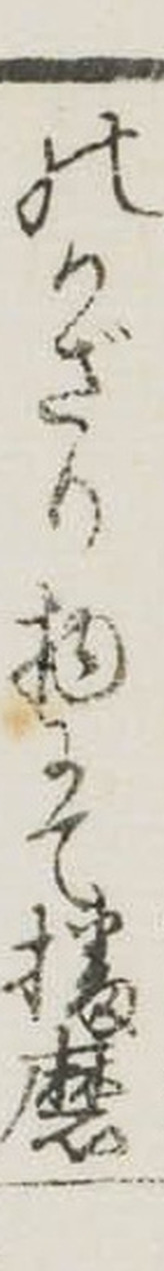のかざり物にて播磨
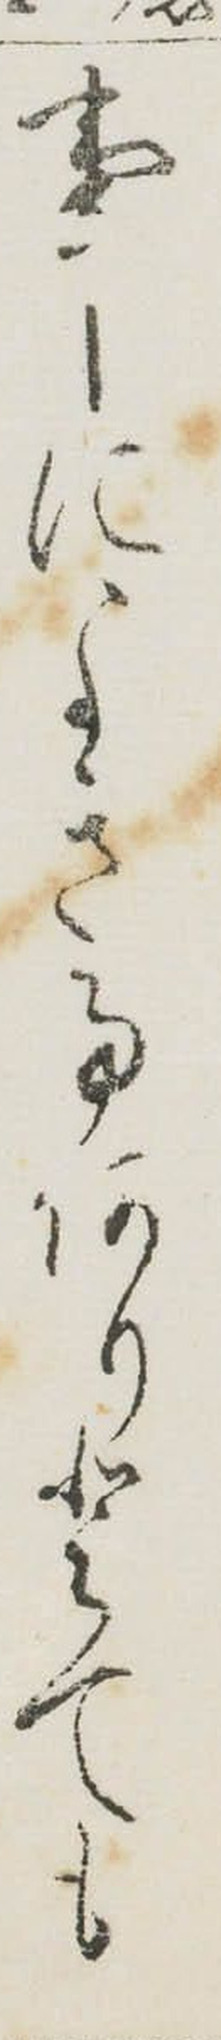事によき事ありとても
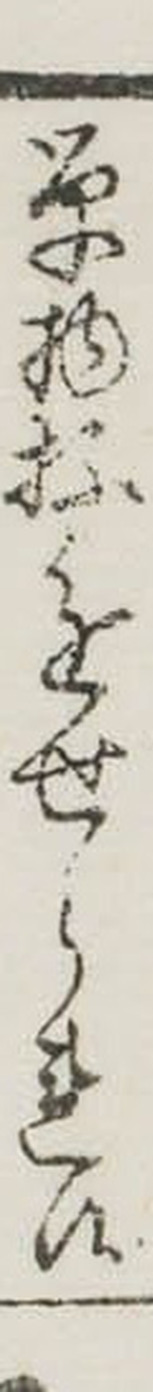単物抔進ぜられ候
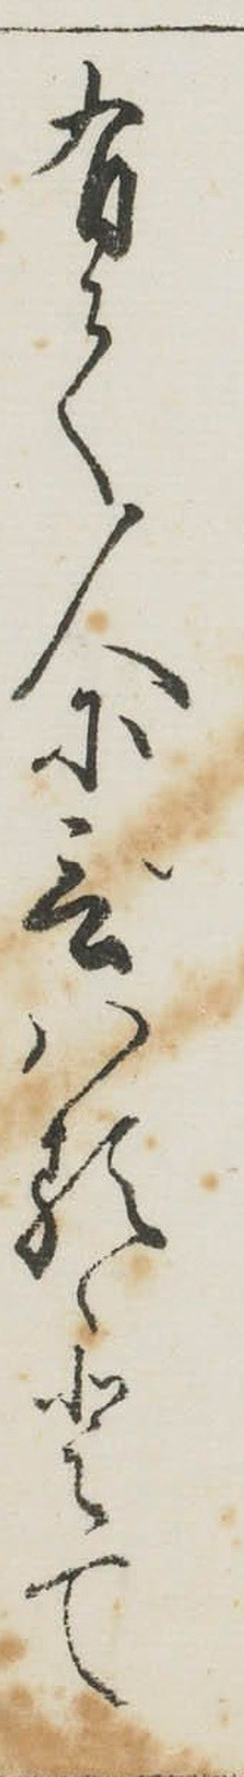有て人に言はるゝとて
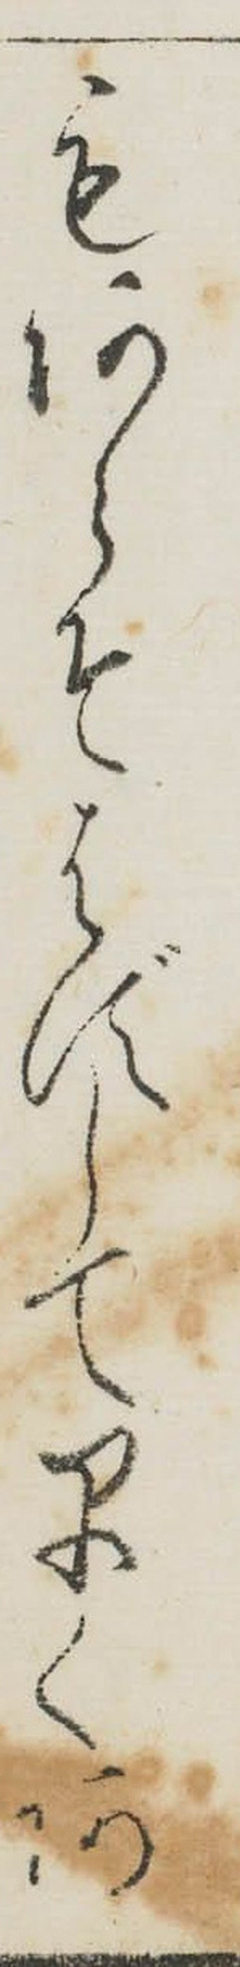もあらそはずして早くあ
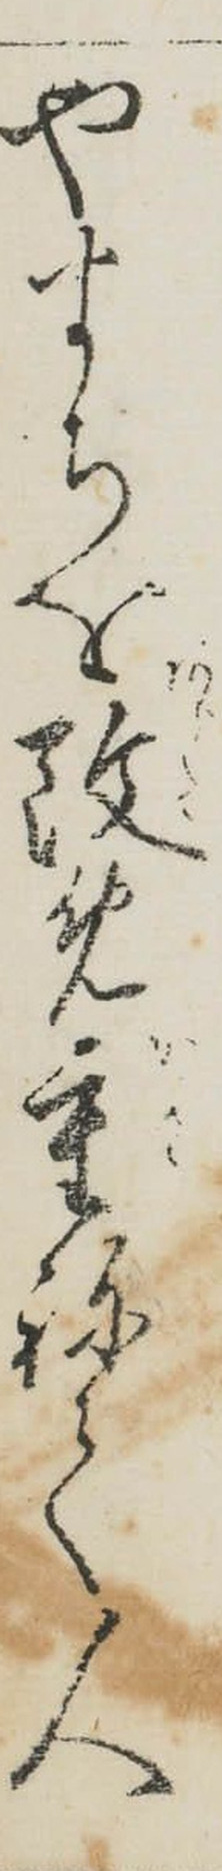やまちを改め重ねて人

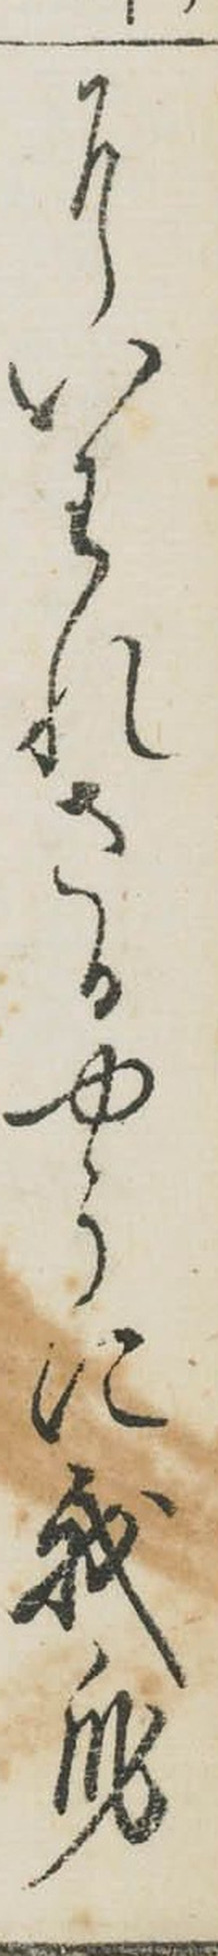にいわれさるやうに我身
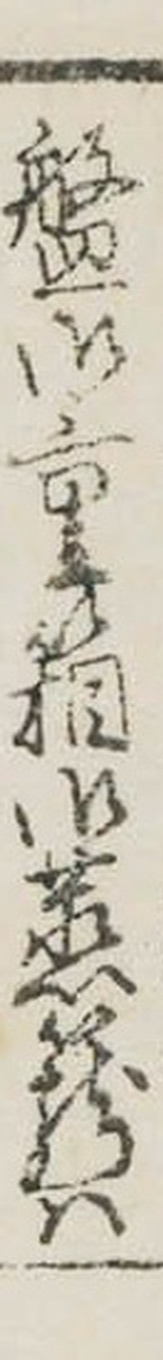盤御重箱御蒸籠は
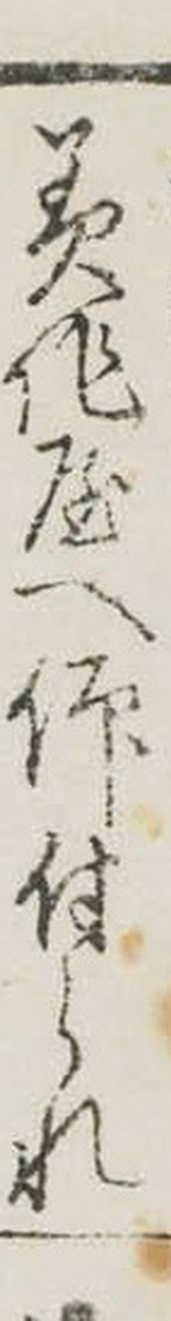美作屋へ仰付られ
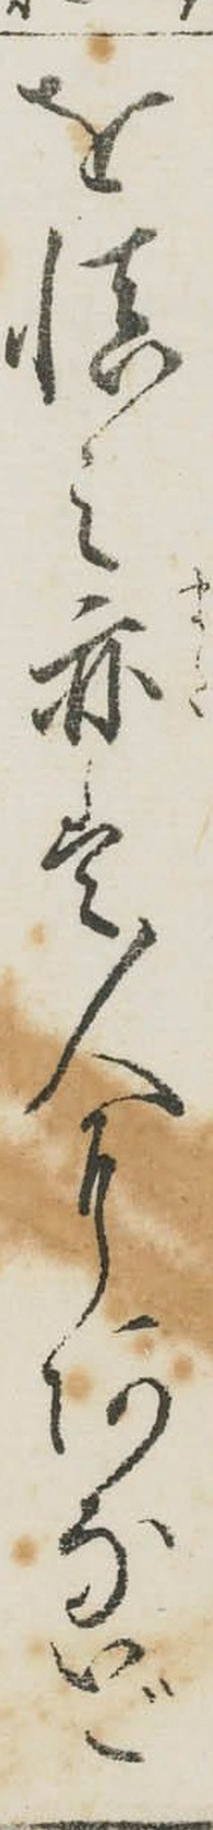を慎み亦は人にあなど
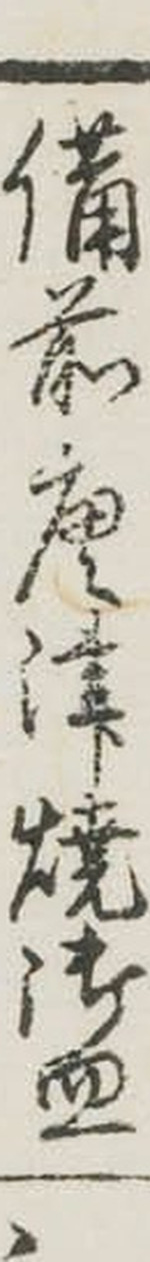備前唐津焼御皿
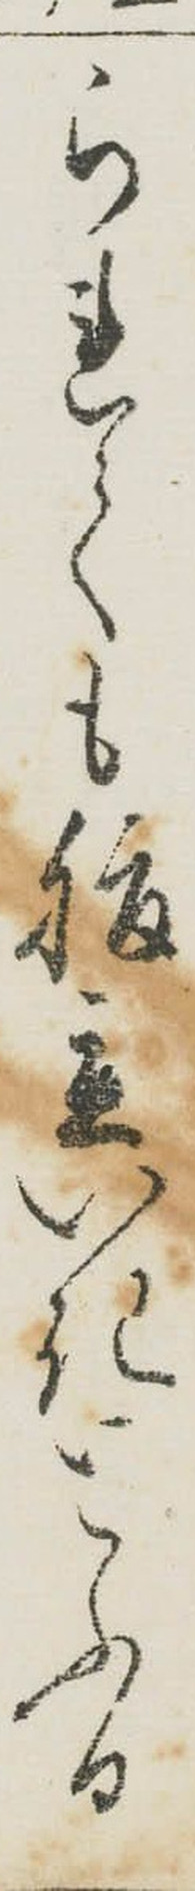られても腹立いきとふる
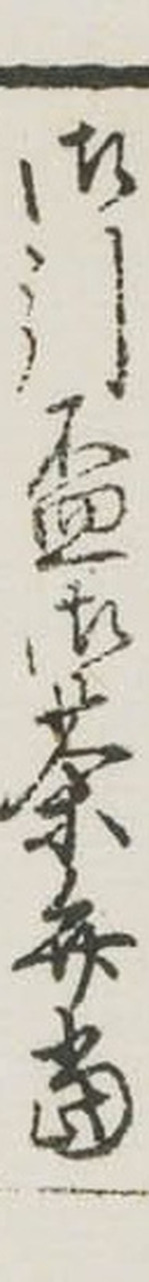御引盃御茶弁当
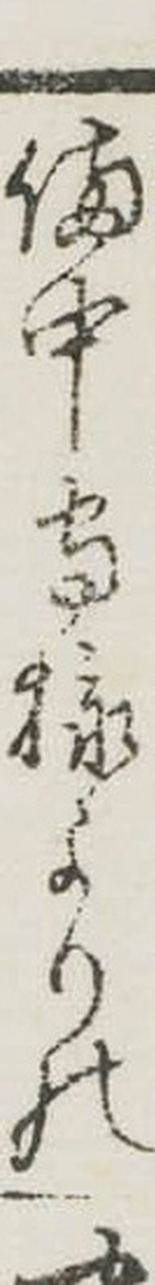備中守様よりの
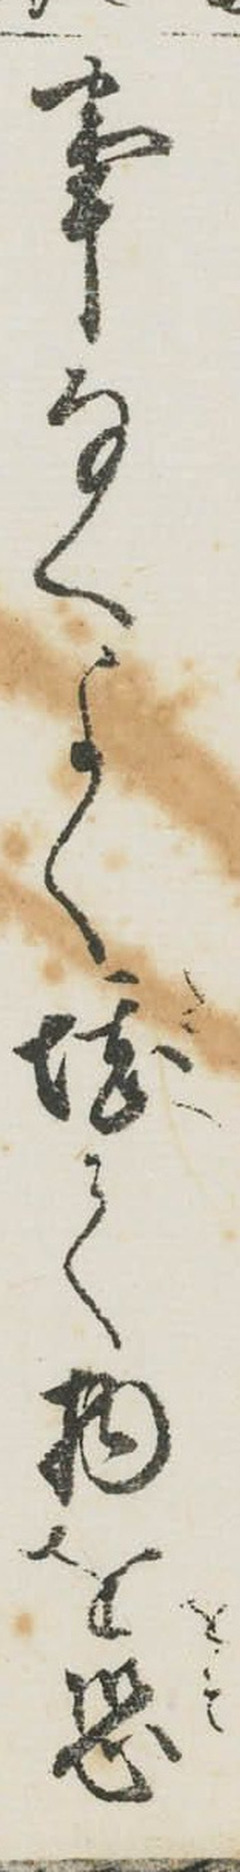事なくよく堪て物を恐
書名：女大学
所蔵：東京学芸大学教育コンテンツアーカイブ
